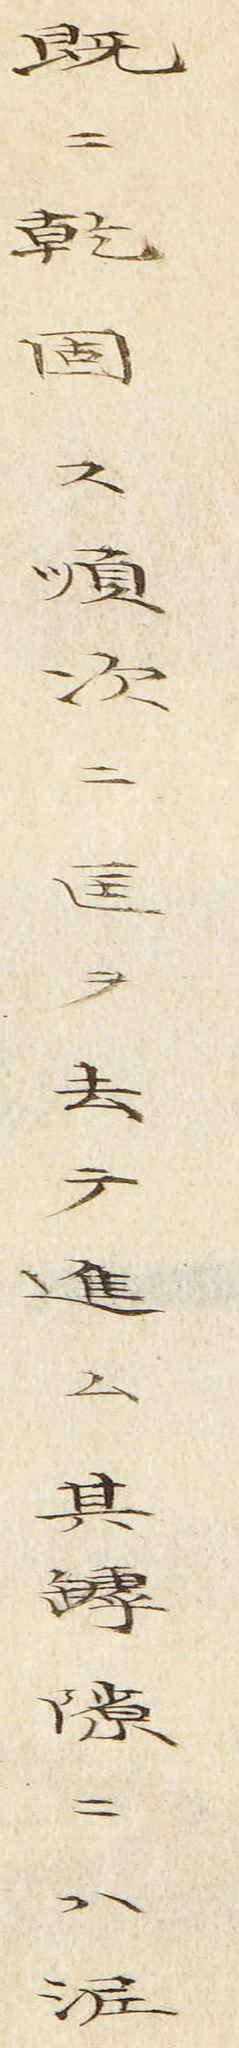既ニ乾固ス順次ニ匡ヲ去テ進ム其罅？隙ニハ泥
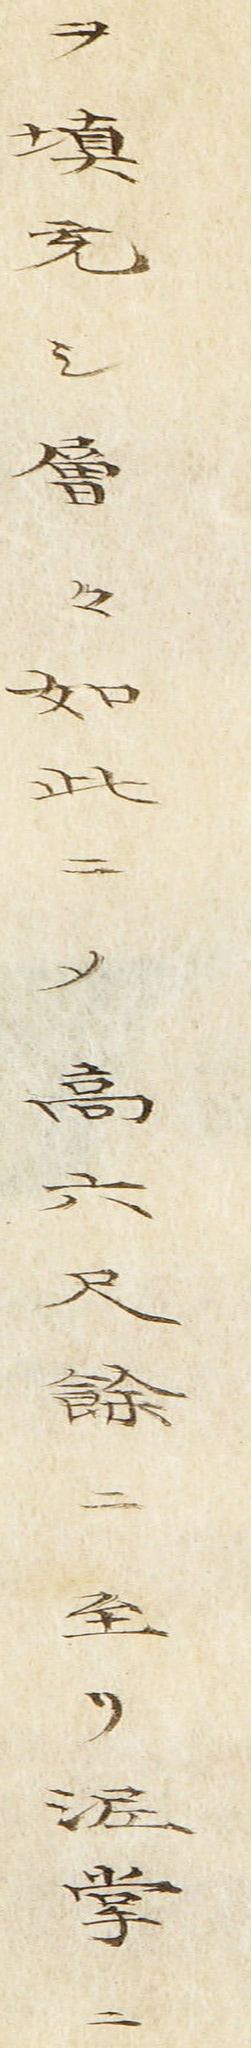ヲ填充シ層々如此ニシテ高六尺余ニ至リ泥掌ニ
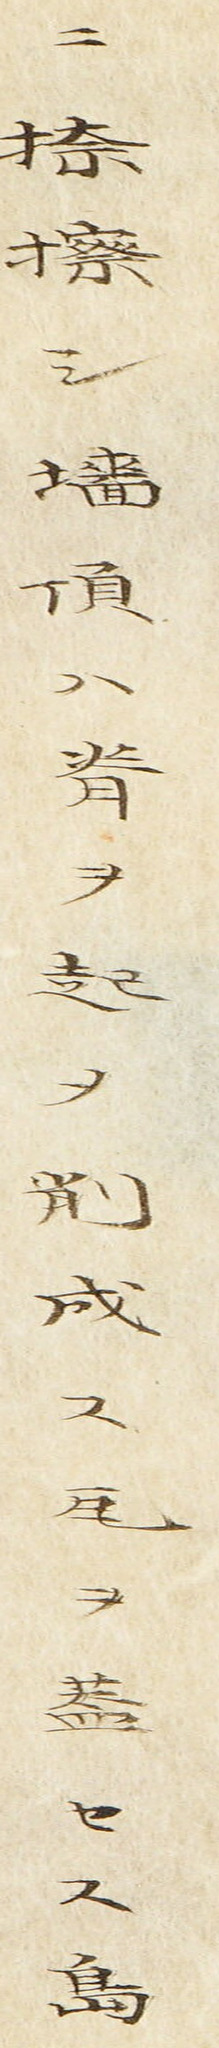ニ捺擦シ墻頂ハ背ヲ起シテ削成ス瓦ヲ蓋セス島
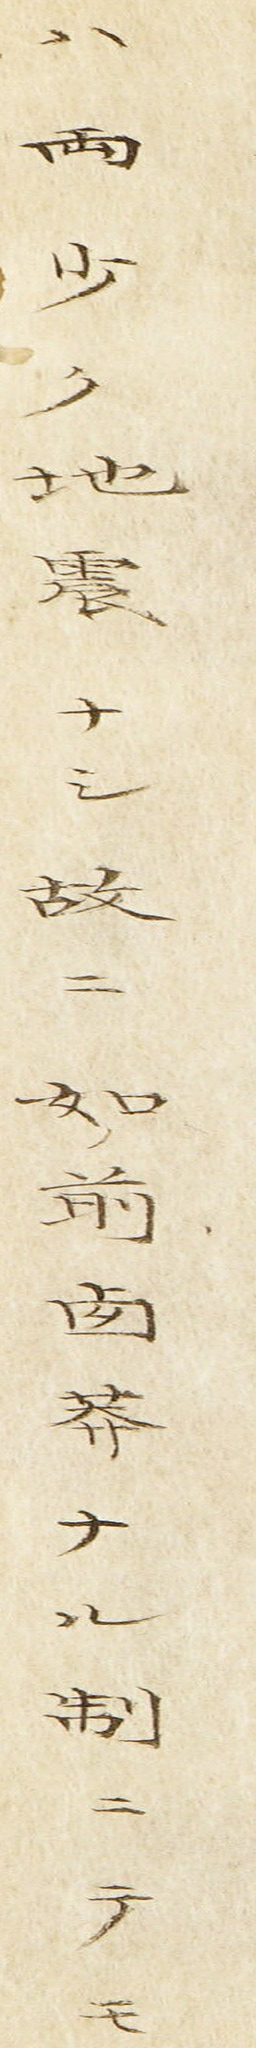ハ両少ク地震ナシ故ニ如前卥莽ナル制ニテモ

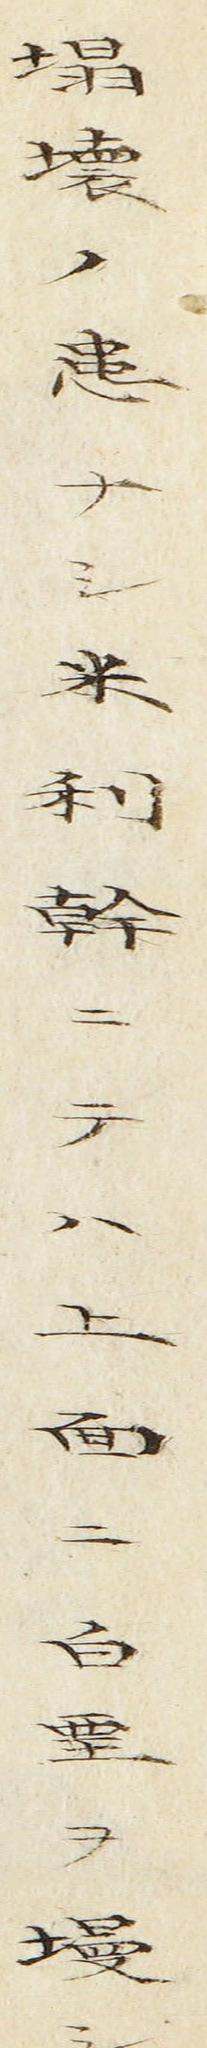塌壊ノ患ナシ米利幹ニテハ上面ニ白垔ヲ墁シ
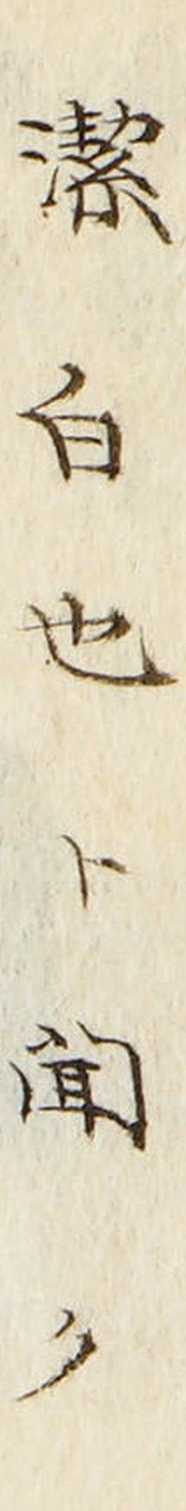潔白也ト聞ク
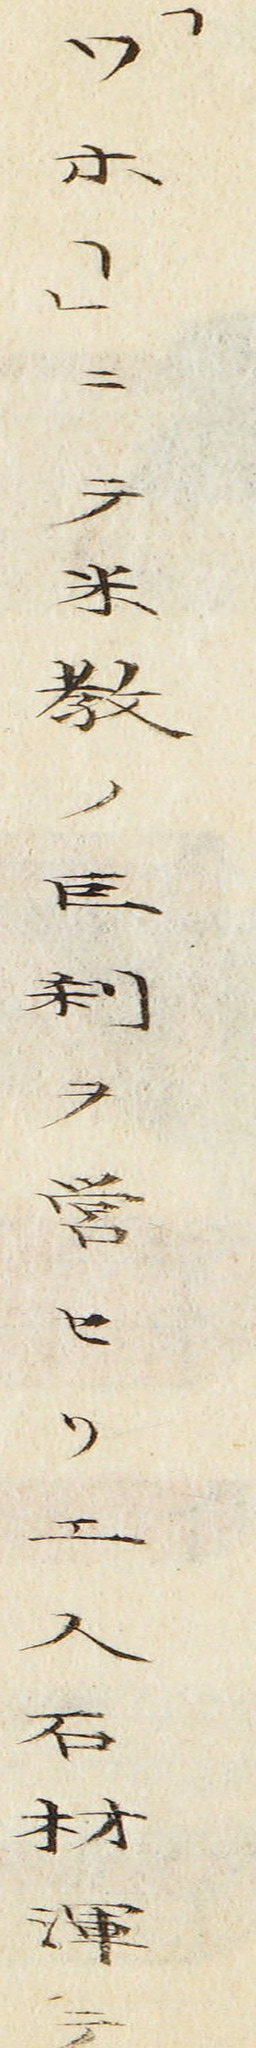〇「ワホー」ニテ米教ノ巨刹ヲ営セリ工人石材渾テ
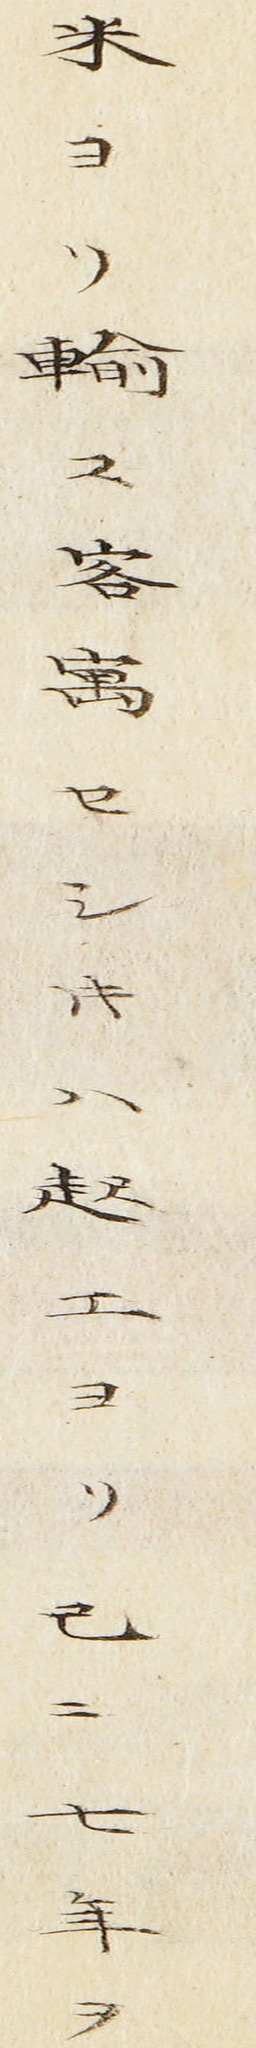米ヨリ輸ス客寓セシトキハ起工ヨリ已ニ七年ヲ
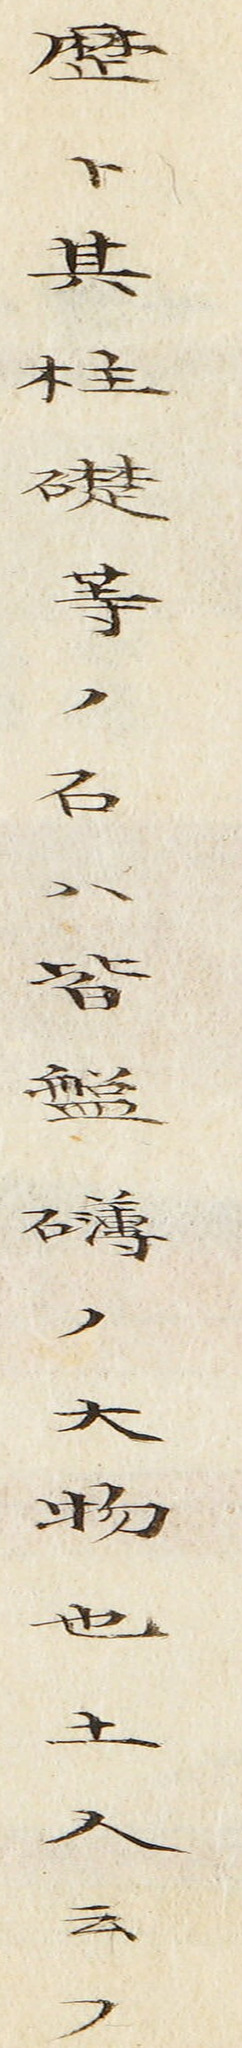歴ト其柱礎等ノ石ハ皆盤礴ノ大物也土人云フ
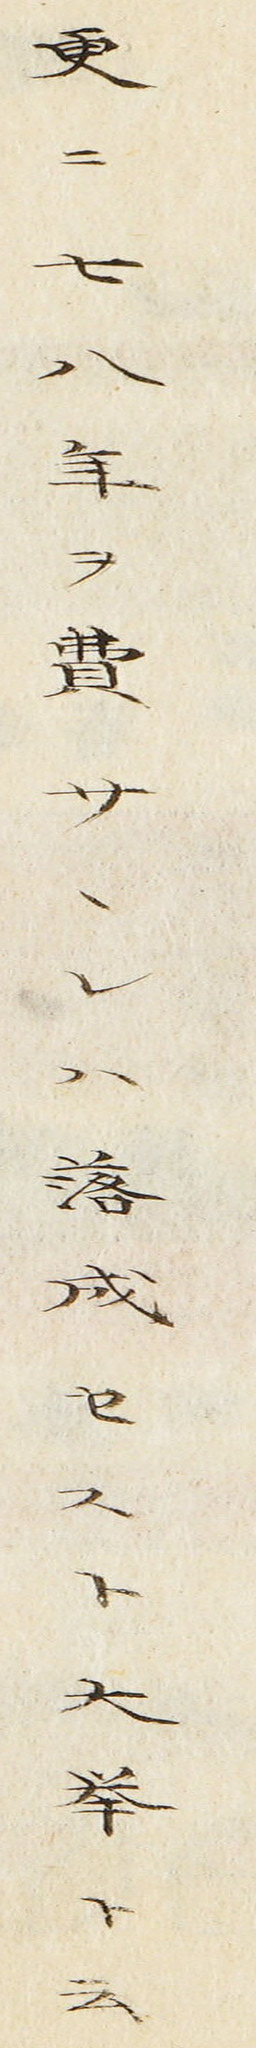更ニ七八年ヲ費サゝレハ落成セスト大挙ト云
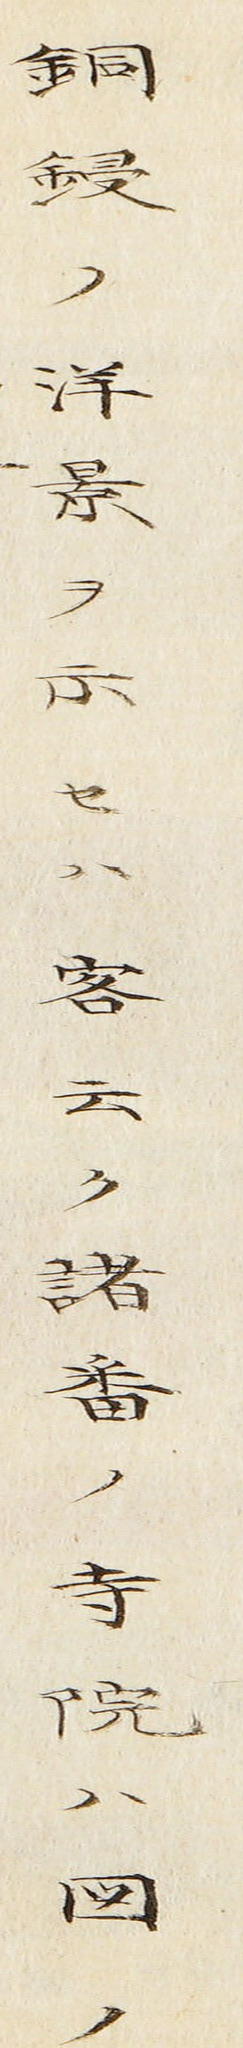〇銅鋟ノ洋景ヲ示セハ客云ク諸番ノ寺院ハ図ノ
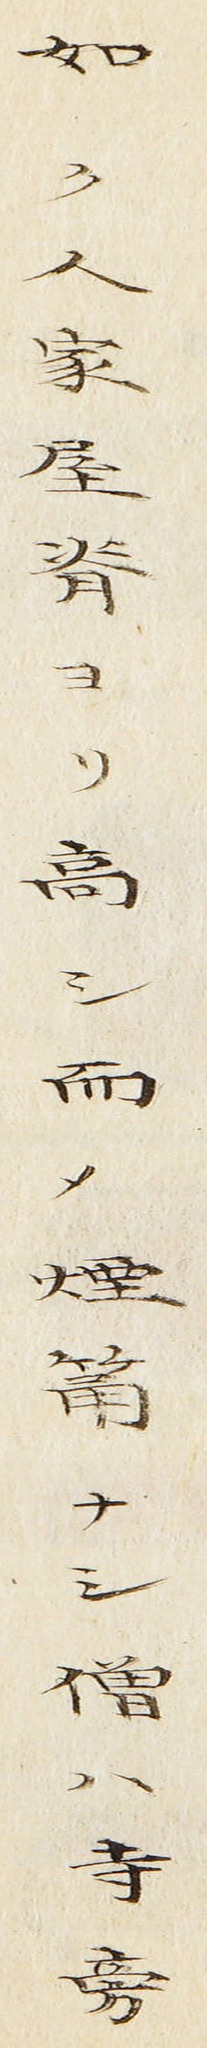如ク人家屋背？ヨリ高シ而シテ煙筩ナシ僧ハ寺旁
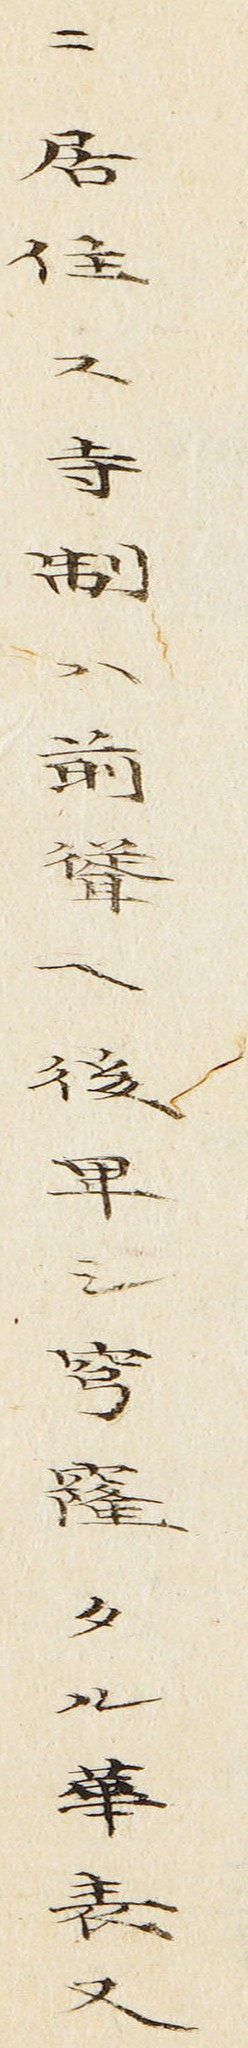ニ居住ス寺制ハ前聳ヘ後卑シ穹窿タル華表又
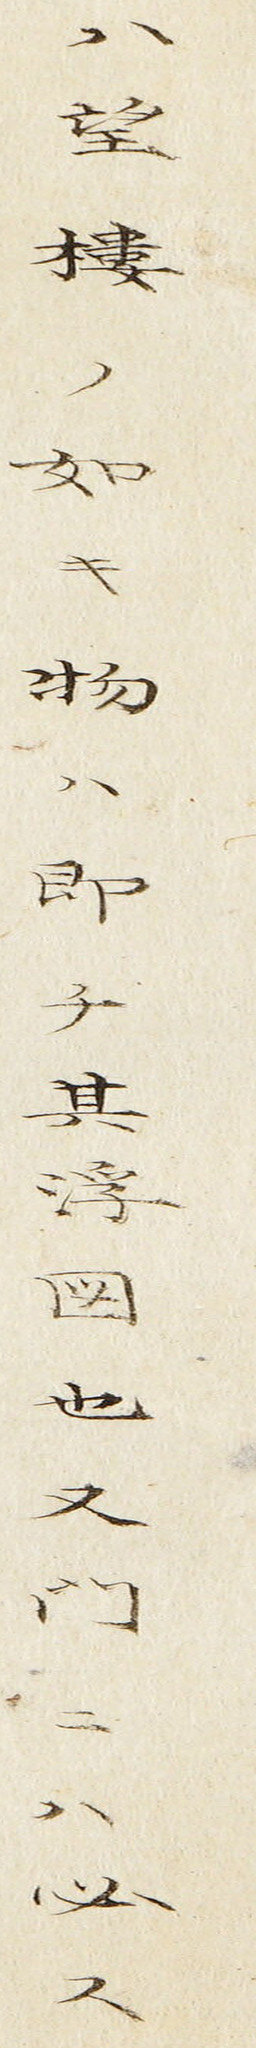ハ望楼ノ如キ物ハ即チ其浮図也又門ニハ必ス
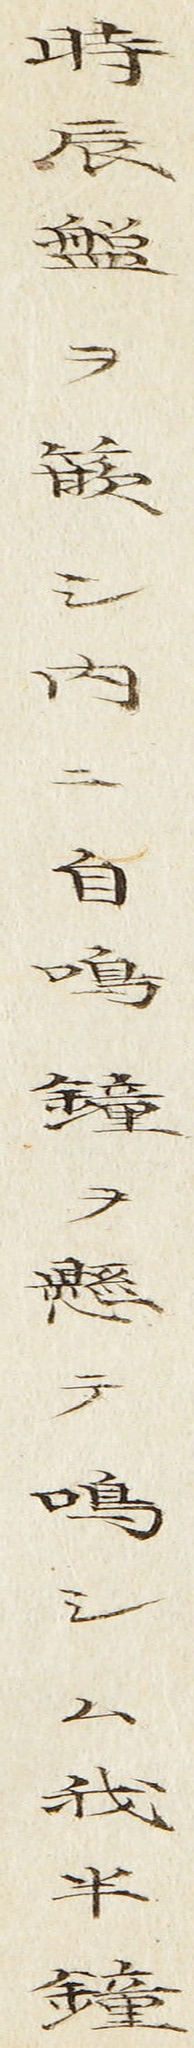時辰盤ヲ嵌シ内ニ自鳴鐘ヲ懸テ鳴シム我半鐘
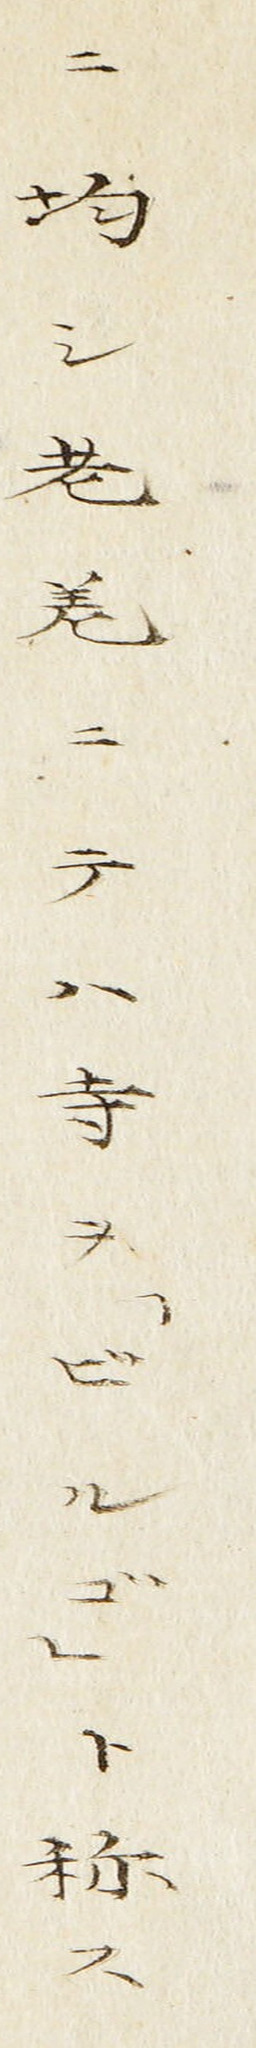ニ均シ老羗？ニテハ寺ヲ「ビルゴ」ト称ス
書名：蕃談
